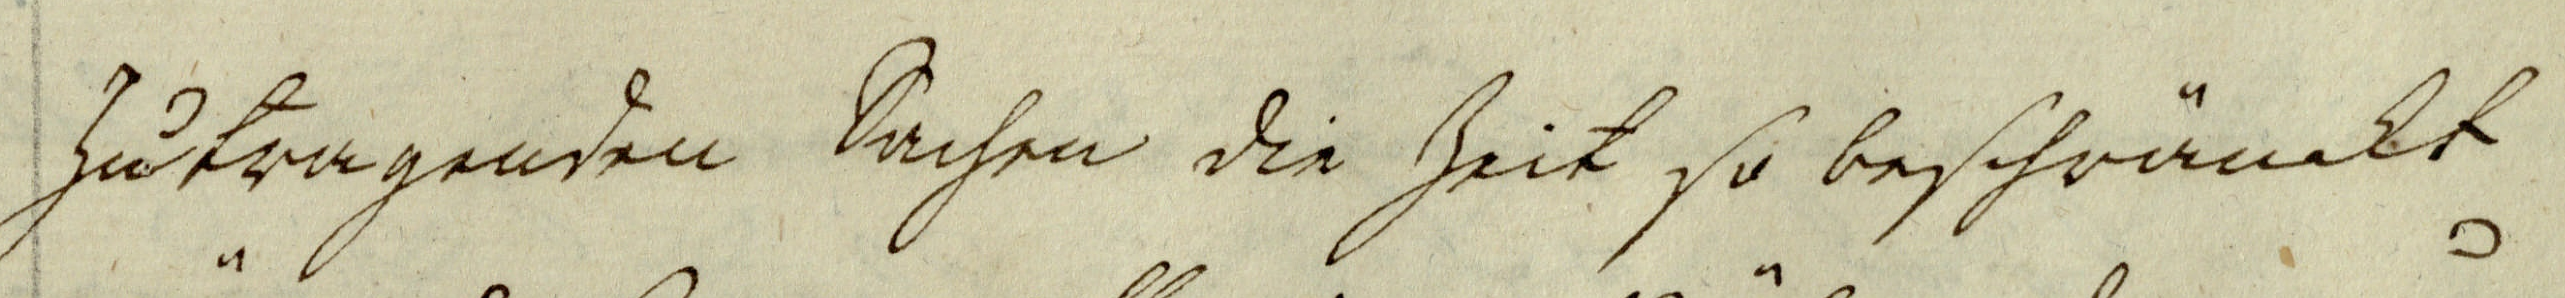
zutragenden Sachen die Zeit so beschränckt
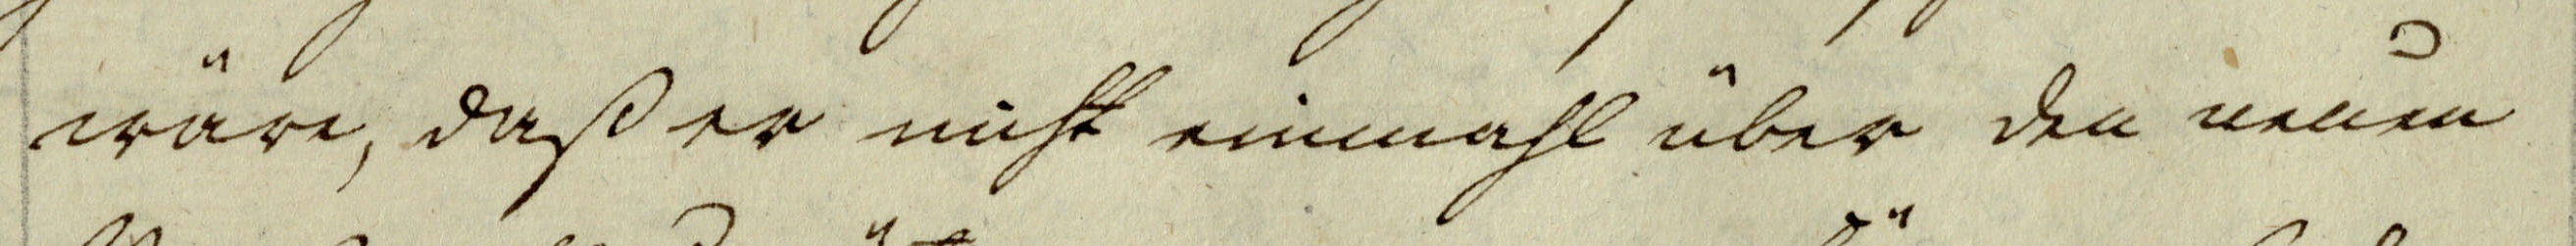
wäre, daß er nicht einmahl über den neuen
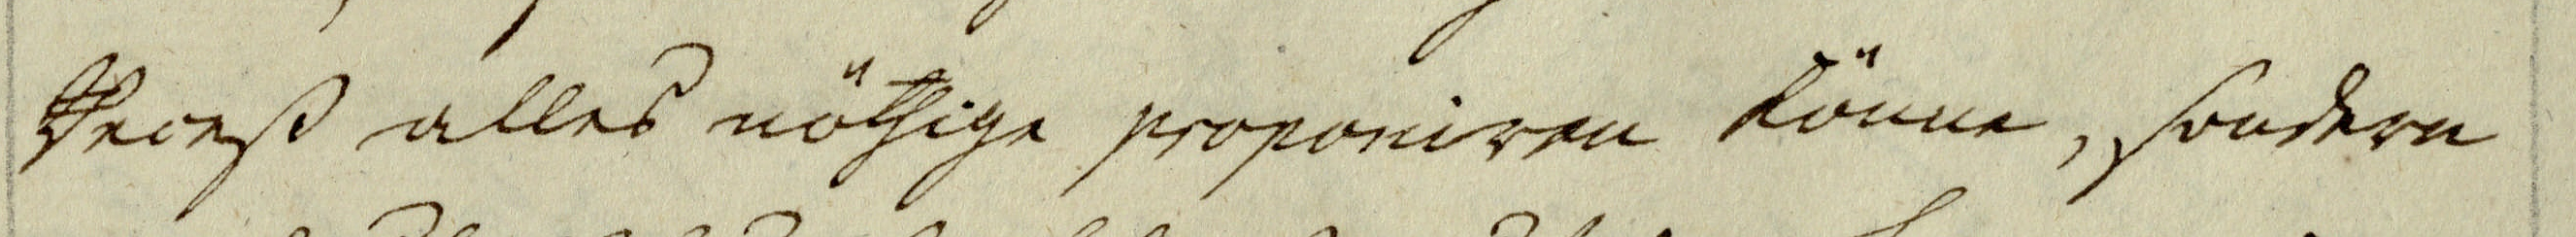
Receß alles nöthige proponiren könne, sondern
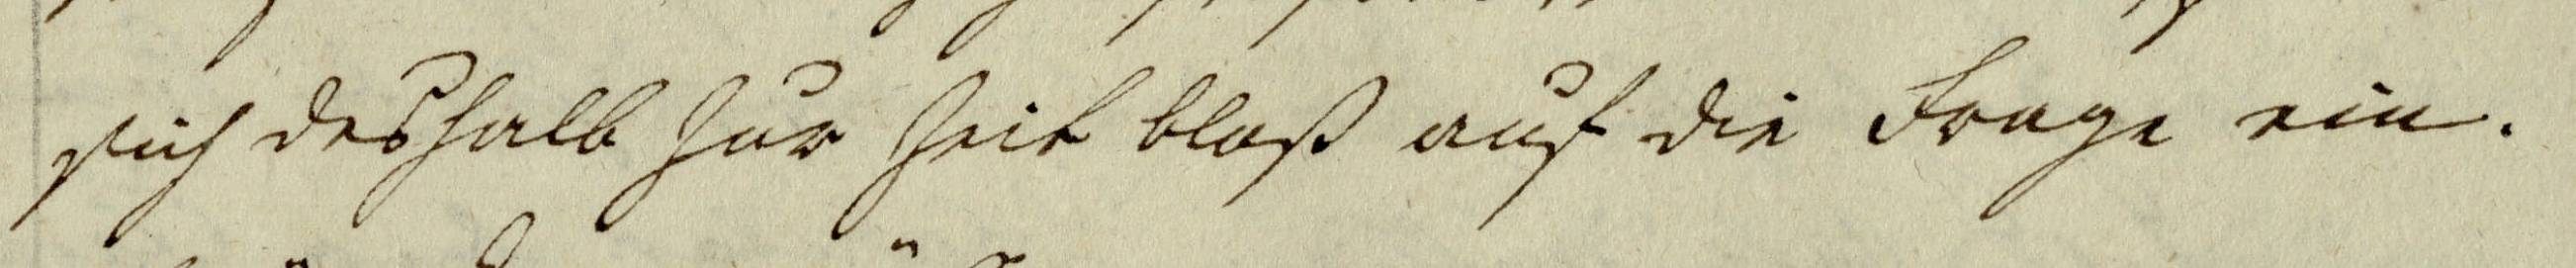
sich deshalb zur Zeit bloß auf die Frage ein¬
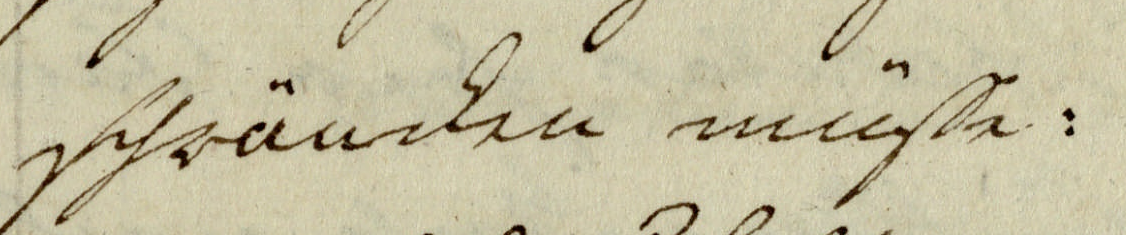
schräncken müsse:
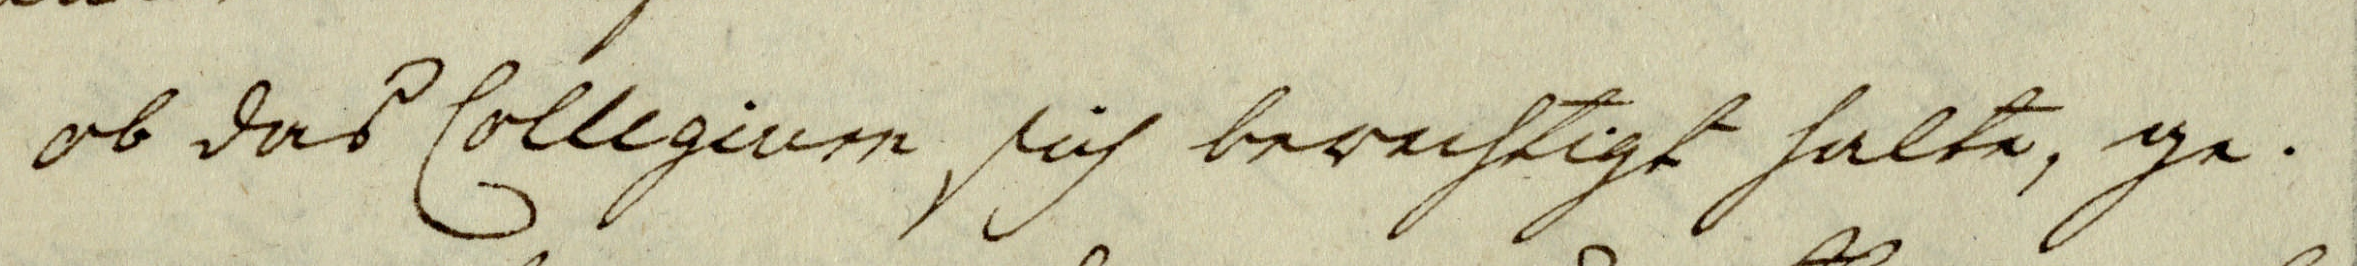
ob das Collegium sich berechtigt halte, ge¬
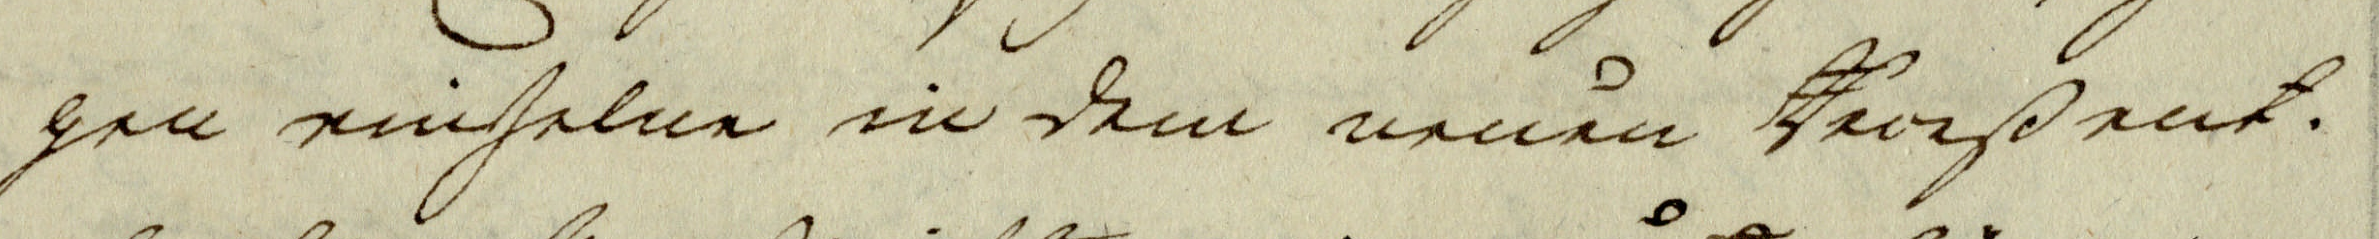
gen einzelne in dem neuen Receß ent¬
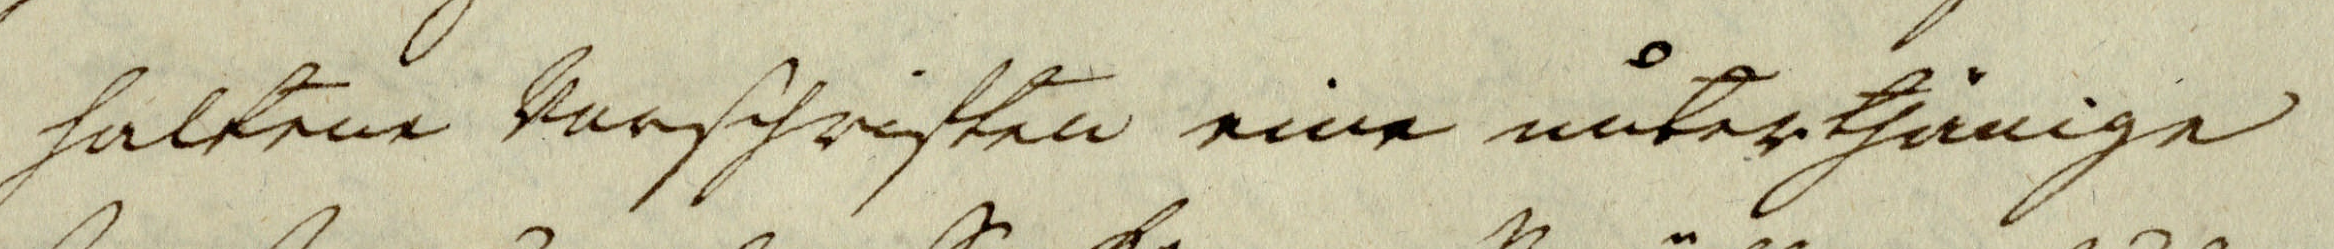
haltene Vorschriften eine unterthänige
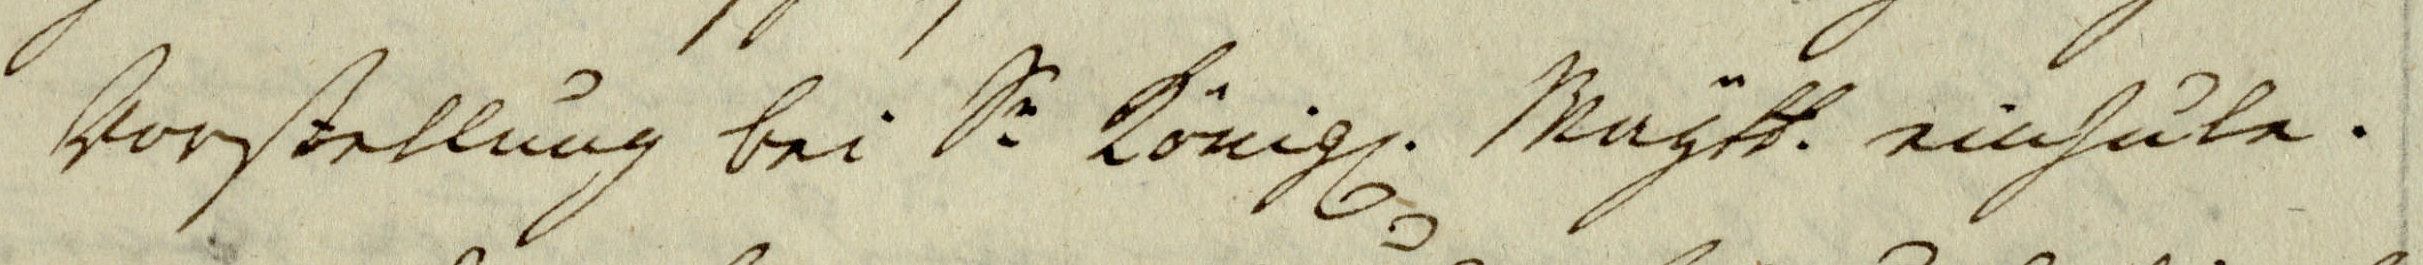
Vorstellung bei Sr Königl. Maÿtt. einzule¬
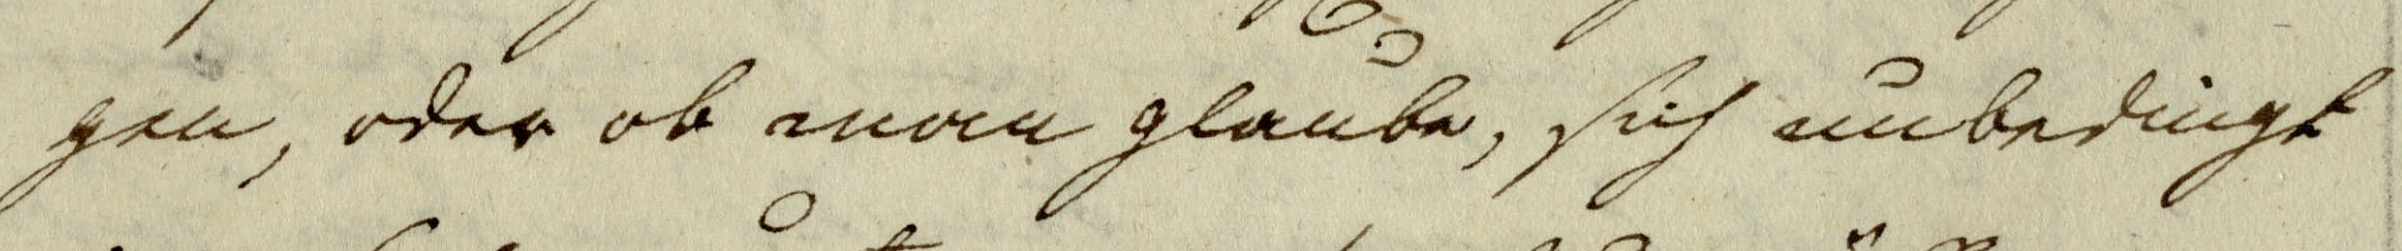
gen, oder ob man glaube, sich unbedingt
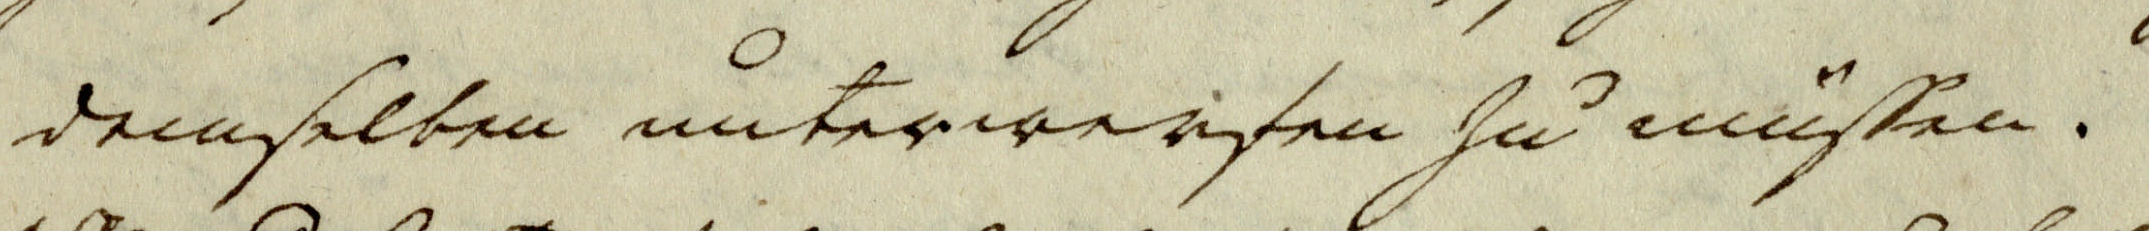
demselben unterwerfen zu müssen.
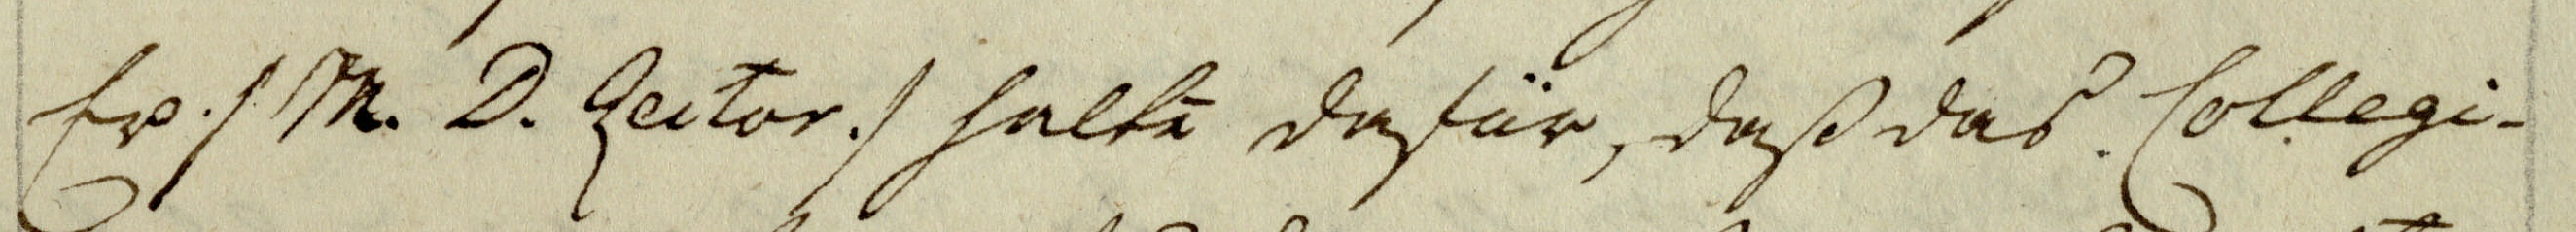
Er ./ M. D. Rector ./ halte dafür, daß das Collegi¬
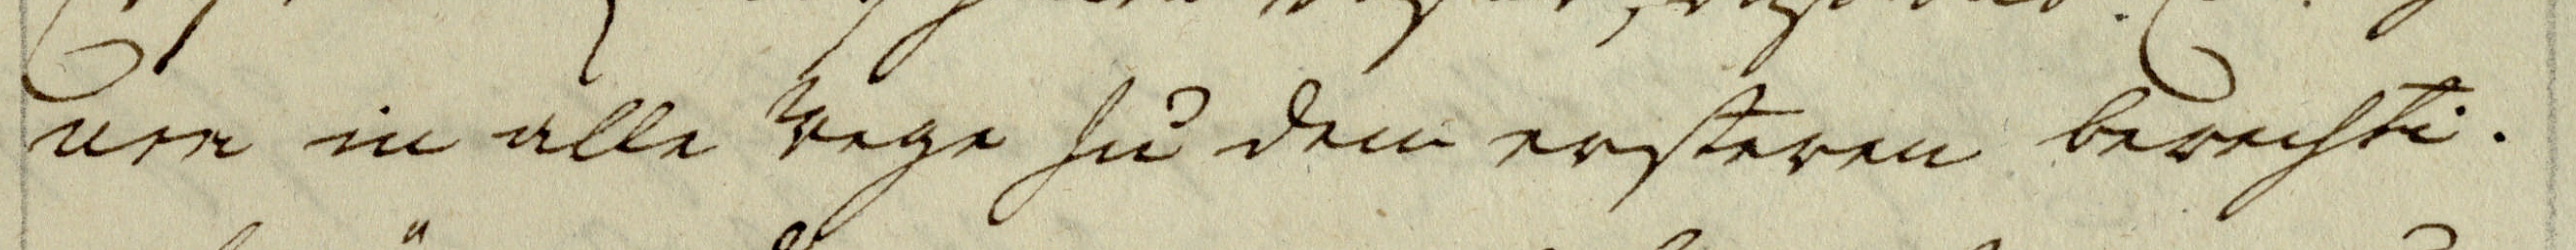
um in alle Wege zu dem ersteren berechti¬
